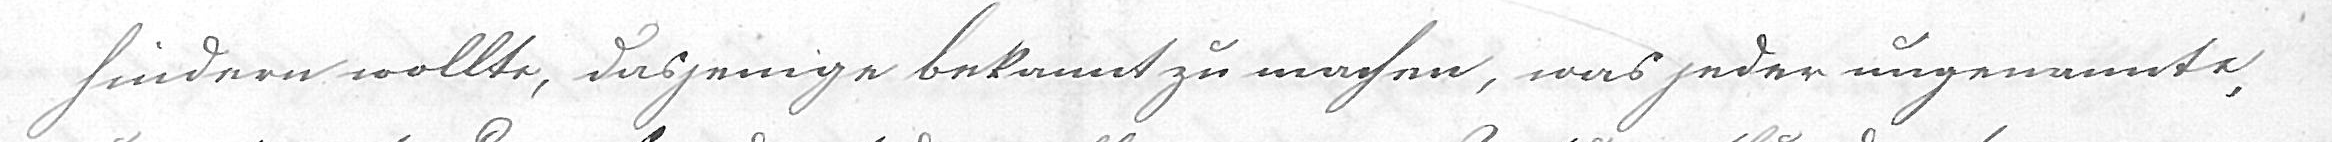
hindern wollte, dasjenige bekannt zu machen, was jeder ungenannte,
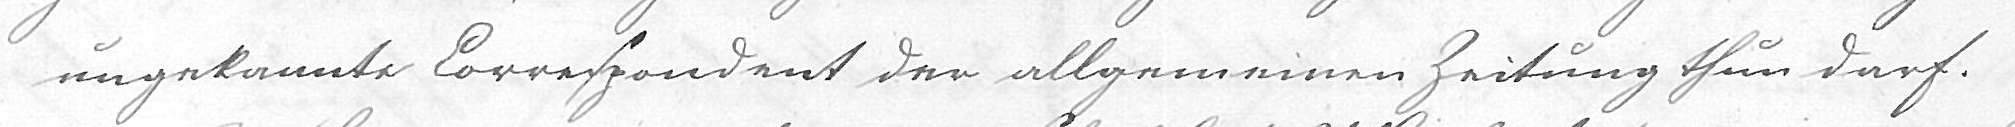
ungekannte Correspondent der allgemeinen Zeitung thun darf.
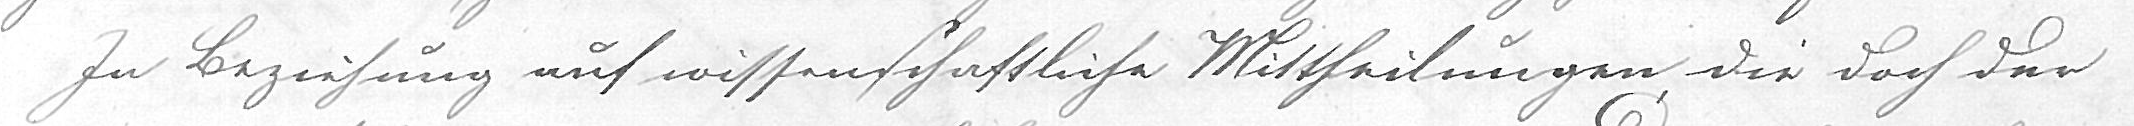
In Beziehung auf wissenschaftliche Mittheilungen, die doch der
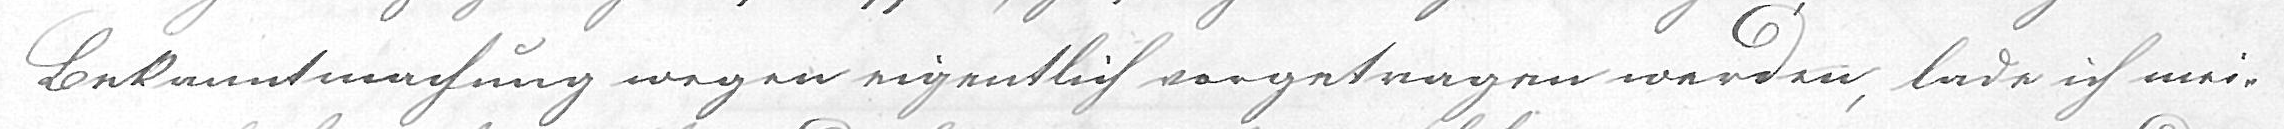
Bekanntmachung wegen eigentlich vorgetragen werden, lade ich mei-
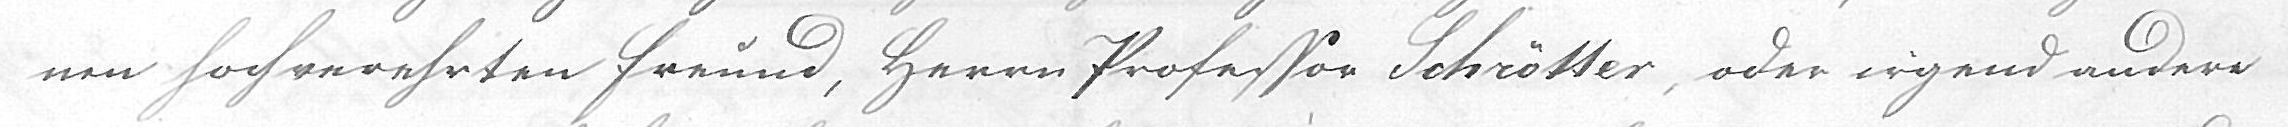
nen hochverehrten Freund, Herrn Professor Schrötter, oder irgend andere
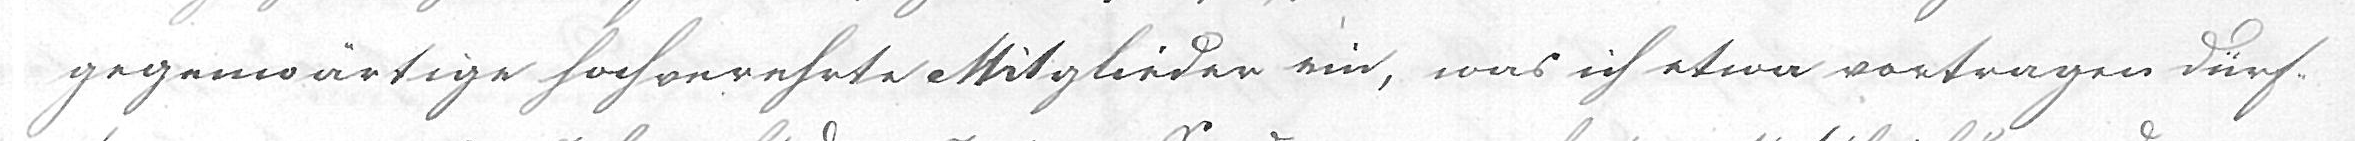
gegenwärtige hochverehrte Mitglieder ein, was ich etwa vorgetragen dürf-
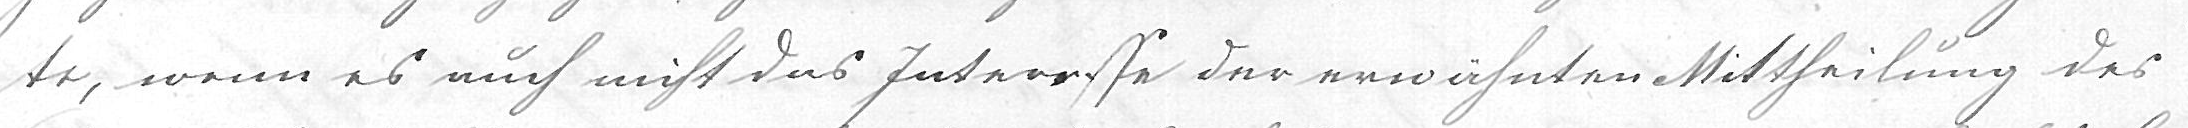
te, wenn es auch nicht das Interesse der erwähnten Mittheilung des
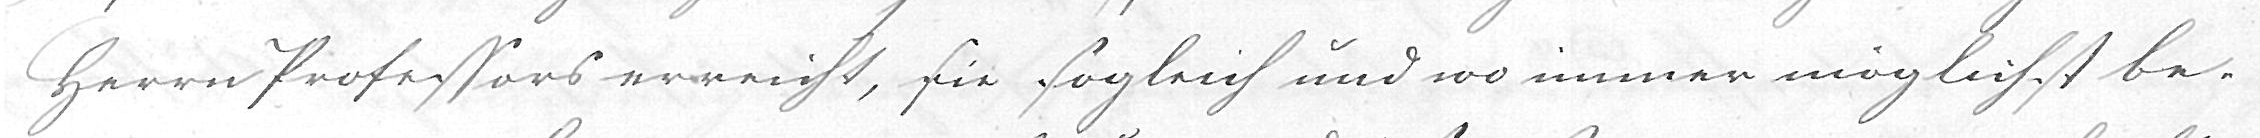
Herrn Professors erreicht, sie sogleich und wo immer möglichst be-
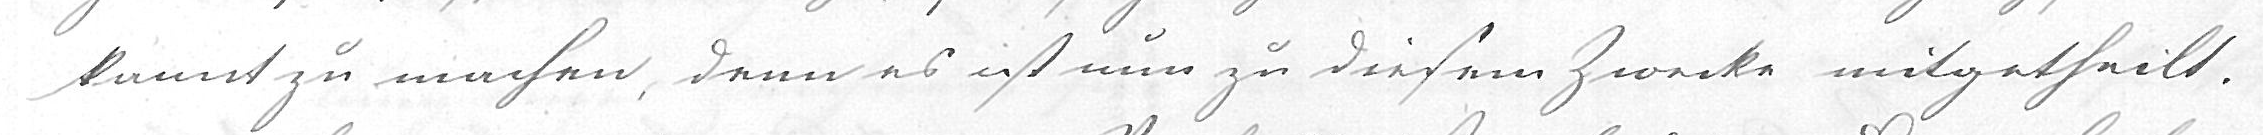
kannt zu machen, denn es ist nun zu diesem Zwecke mitgetheilt.
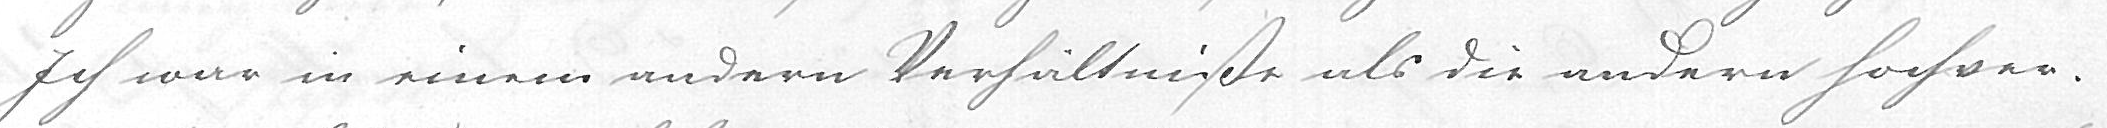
Ich war in einem andern Verhältnisse als die andern hochver-
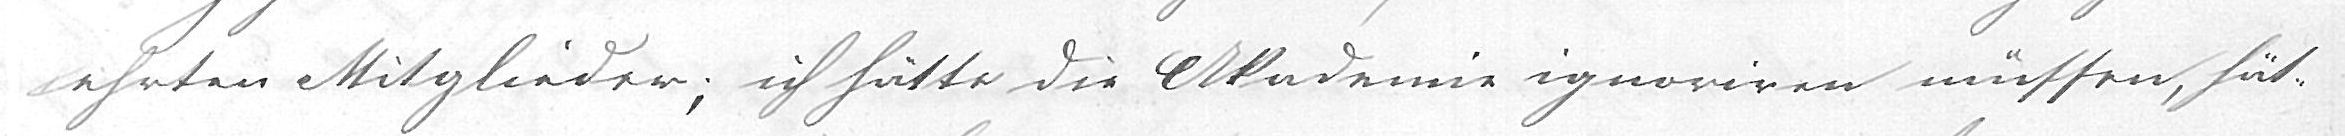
ehrten Mitglieder; ich hätte die Akademie ignoriren müssen, hät-
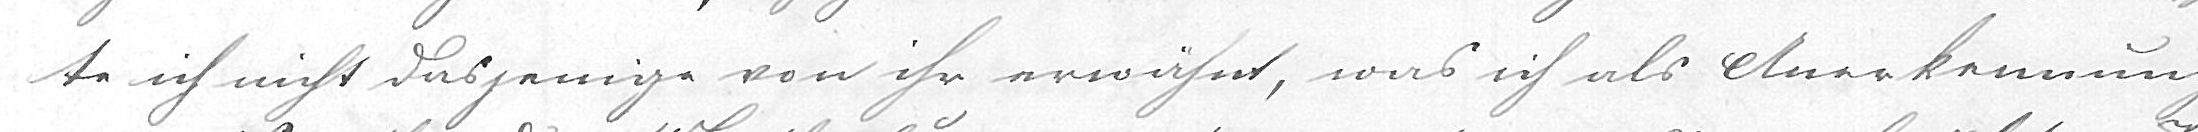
te ich nicht dasjenige von ihr erwähnt, was ich als Anerkennung
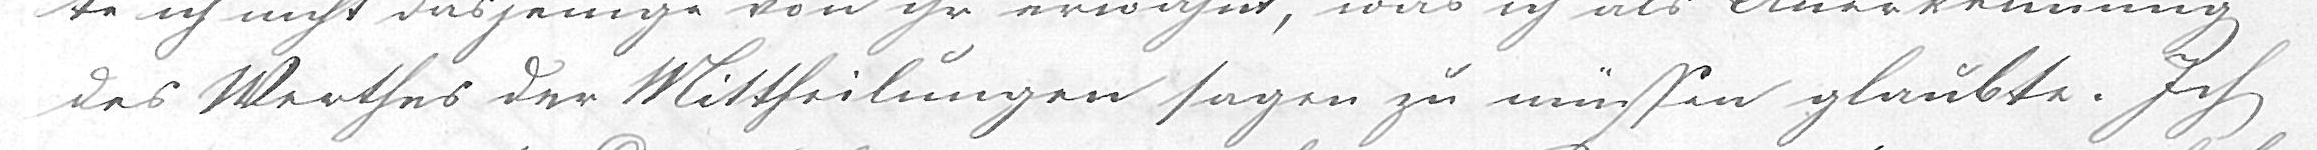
des Werthes der Mittheilungen sagen zu müssen glaubte. Ich
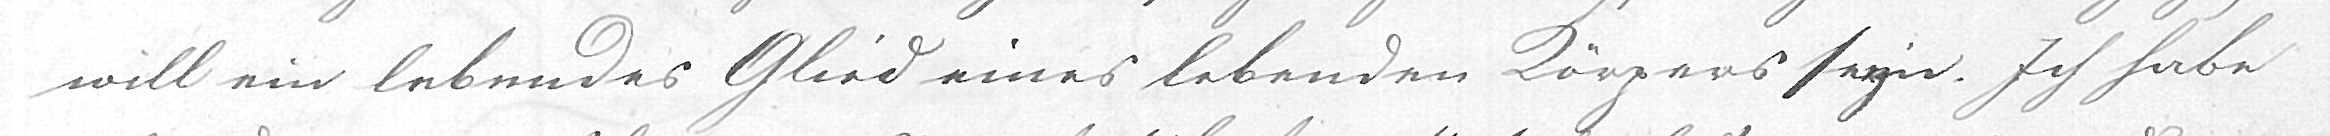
will ein lebendes Glied eines lebenden Körpers seyn. Ich habe
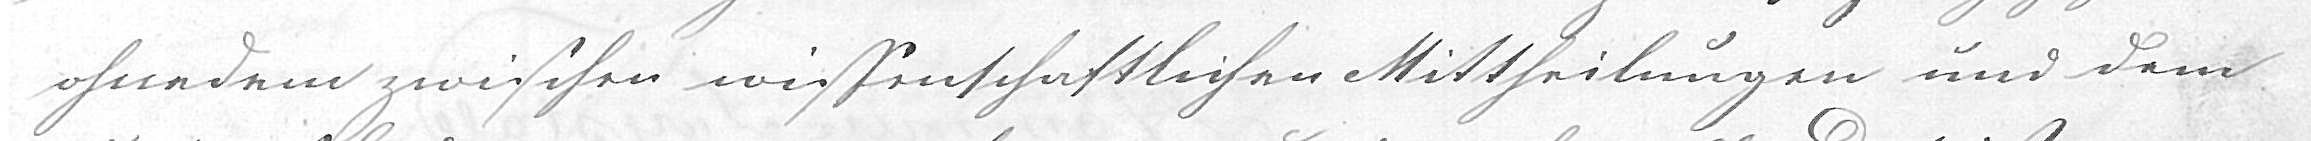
ohnedem zwischen wissenschaftlichen Mittheilungen und dem
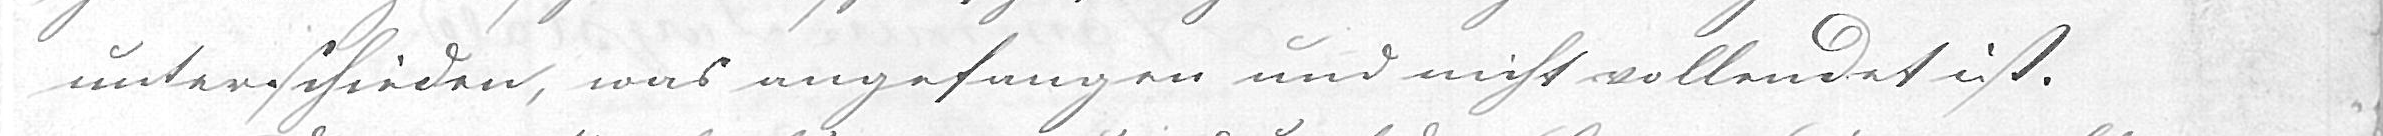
unterschieden, was angefangen und nicht vollendet ist.
